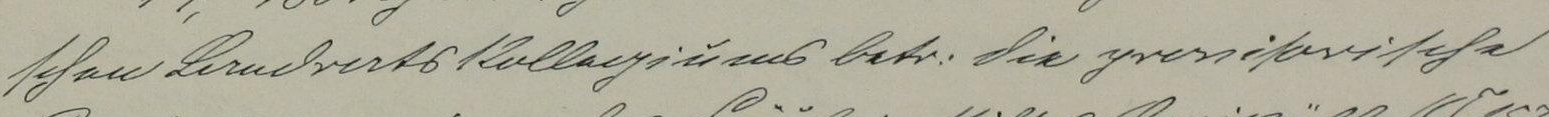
schen Landratskollegiums betr. die provisorische
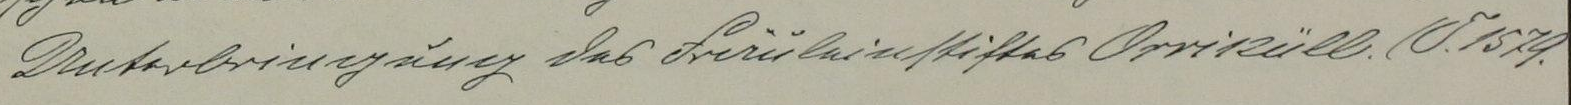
Unterbringung des Fräuleinstiftes Orriküll. (T.1579.
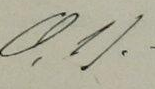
O.1).
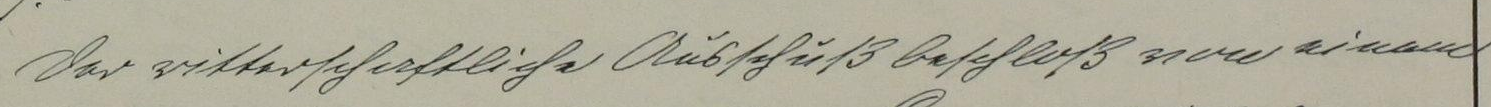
Der ritterschaftliche Ausschuß beschloß von einem
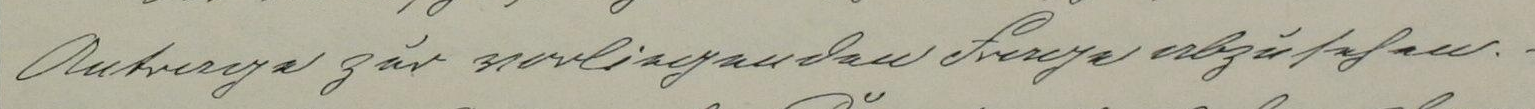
Antrage zur vorliegenden Frage abzusehen.
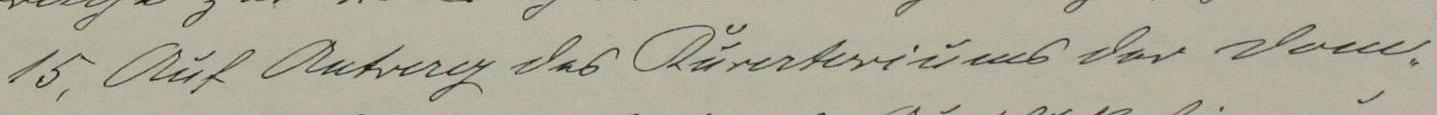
15. Auf Antrag des Kuratoriums der Dom-
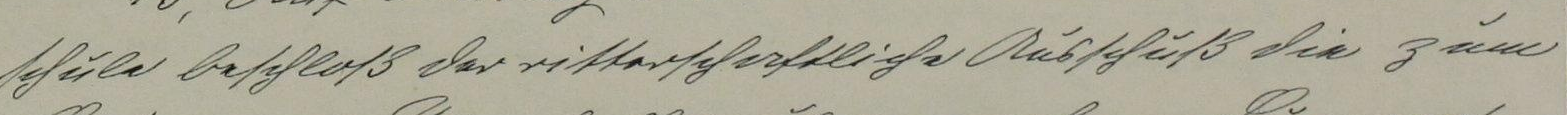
schule beschloß der ritterschaftliche Ausschuß die zum
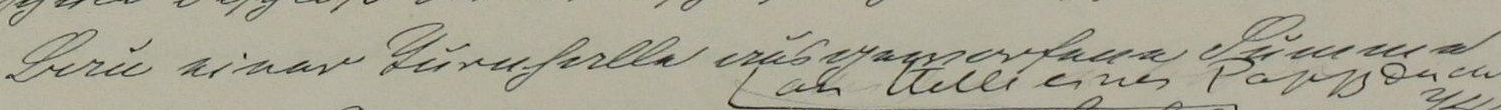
Bau einer Turnhalle ausgeworfene Summe
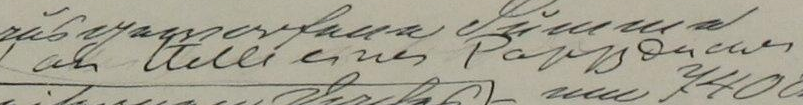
an Stelle eines Pappdaches
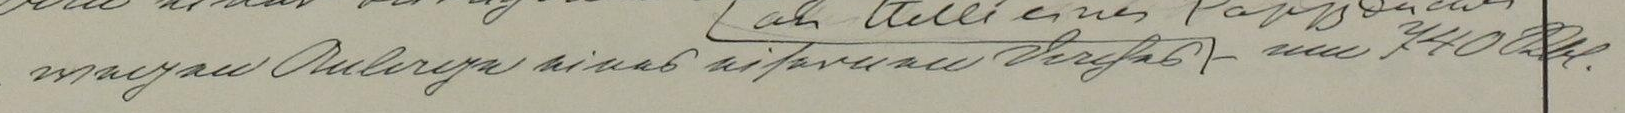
– wegen Anlage eines eisernen Daches – um 740 Rbl.
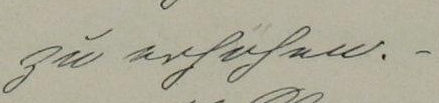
zu erhöhen.
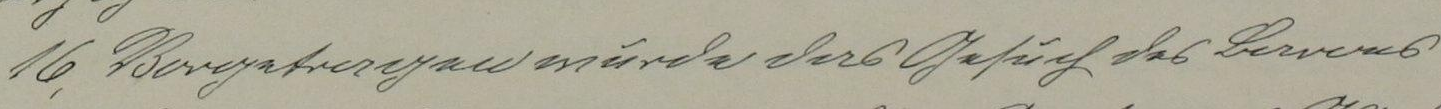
16. Vorgetragen wurde das Gesuch des Barons
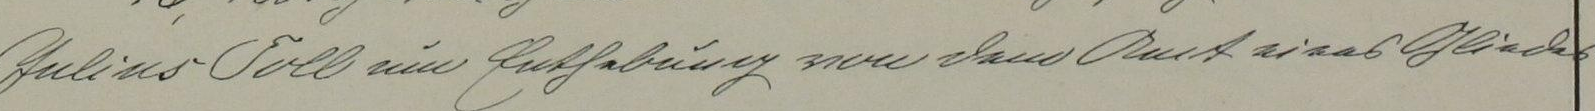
Julius Toll um Enthebung von dem Amt eines Gliedes
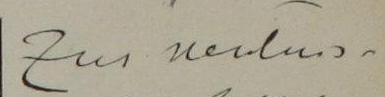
Zurkentnis
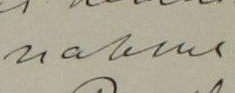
nahme
